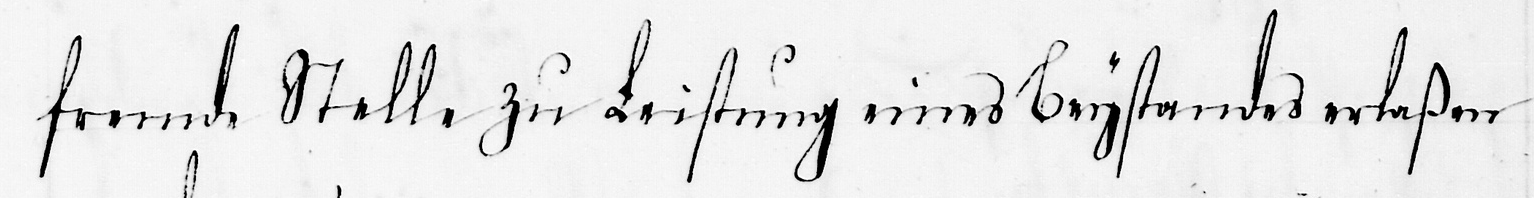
fremde Stelle zu Leistung eines Beystandes erlaßen
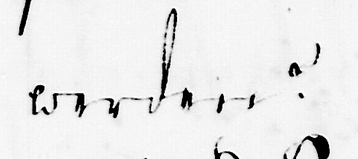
werden?
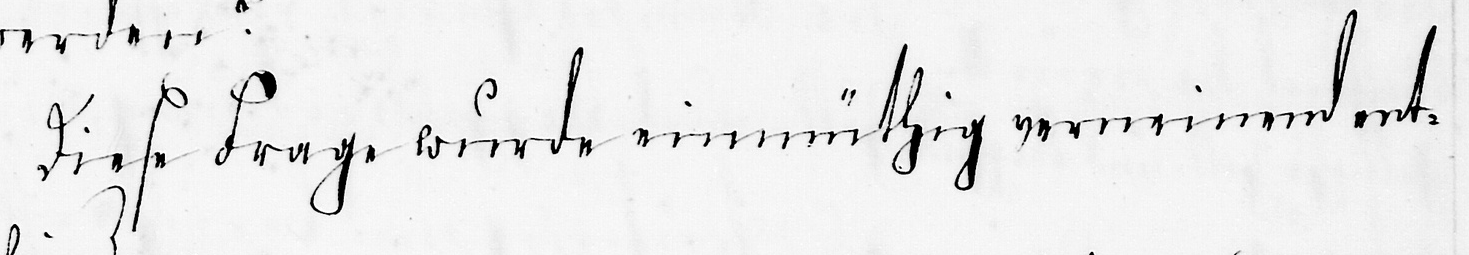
Diese Frage wurde einmüthig verneinend ent¬
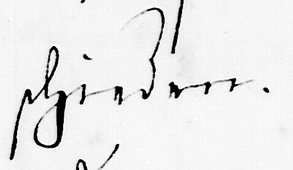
schieden.
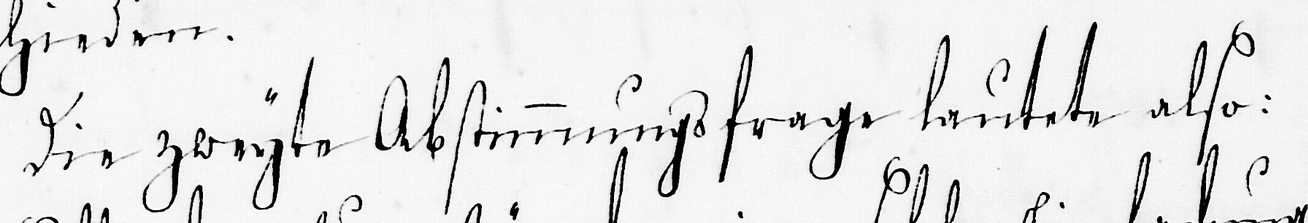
Die zweyte Abstimmungsfrage lautete also:
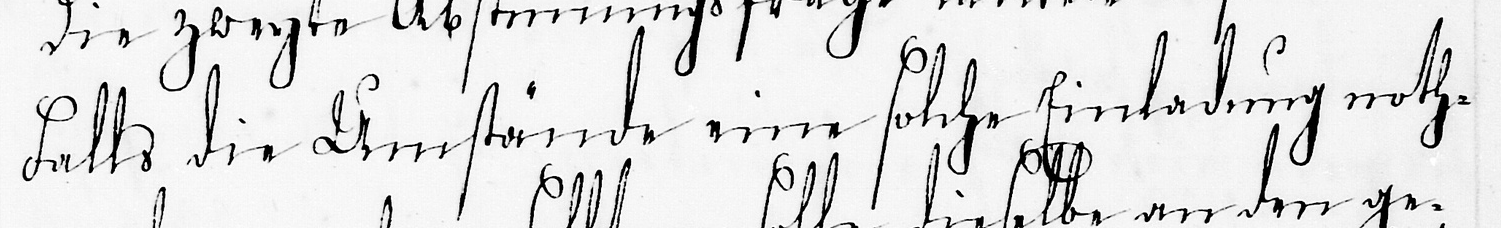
Falls die Umstände eine solche Einladung noth¬
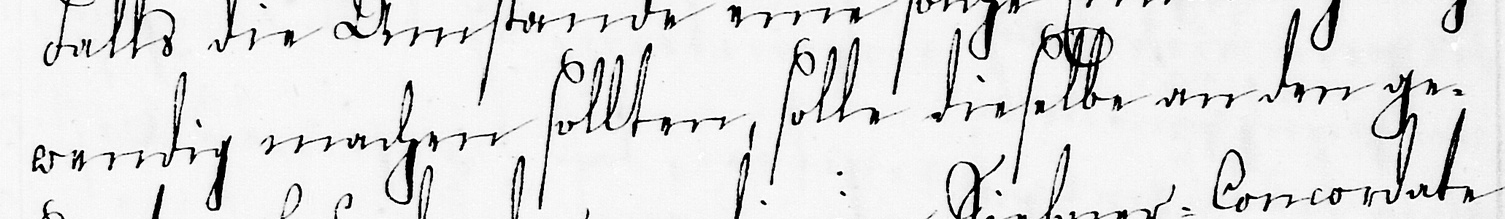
wendig machen sollten, solle dieselbe an den ge¬
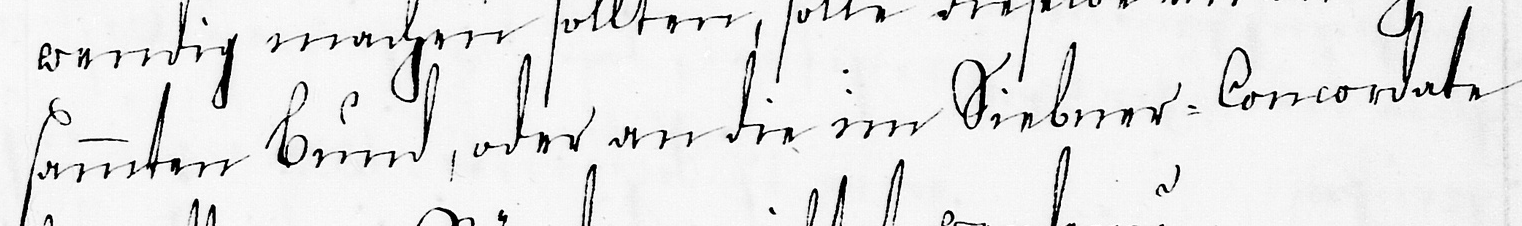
sammten Bund, oder an die im Siebner-Concordate
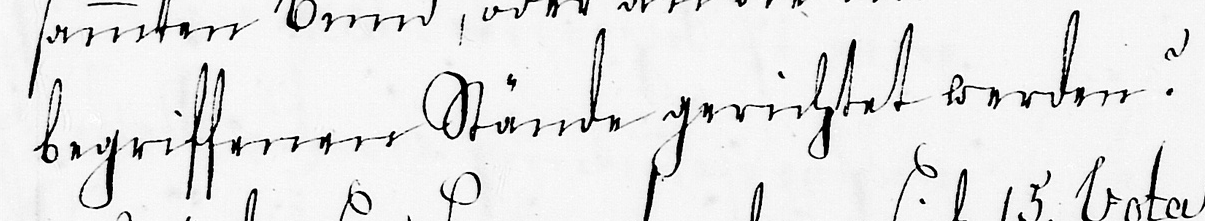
begriffenen Stände gerichtet werden?
